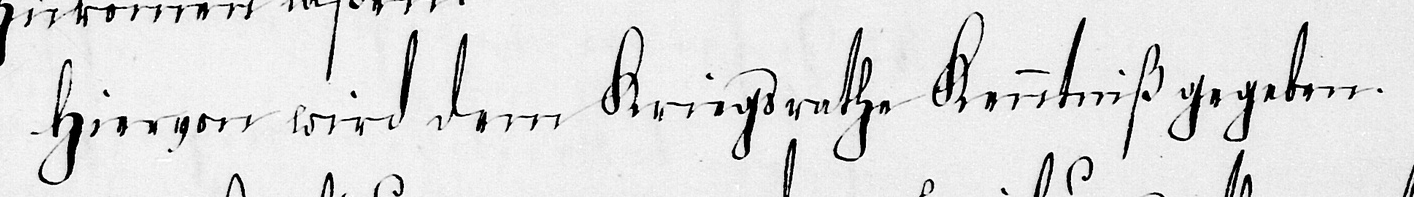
Hiervon wird dem Kriegsrathe Kenntniß gegeben.
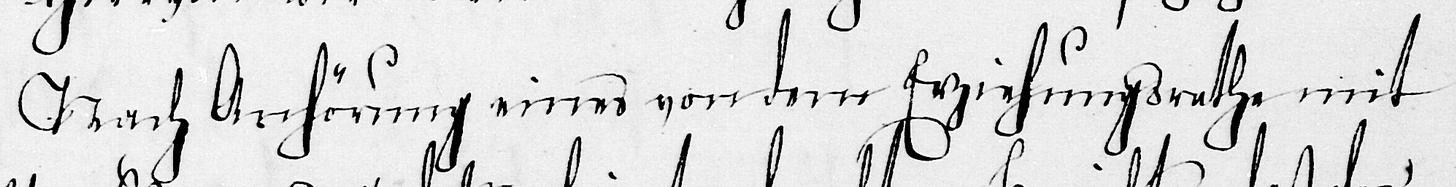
Nach Anhörung eines von dem Erziehungsrathe mit
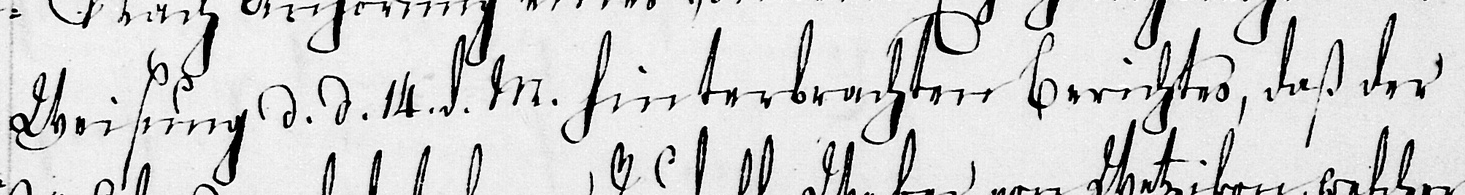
Weisung d. d. 14. d. M. hinterbrachten Berichtes, daß der
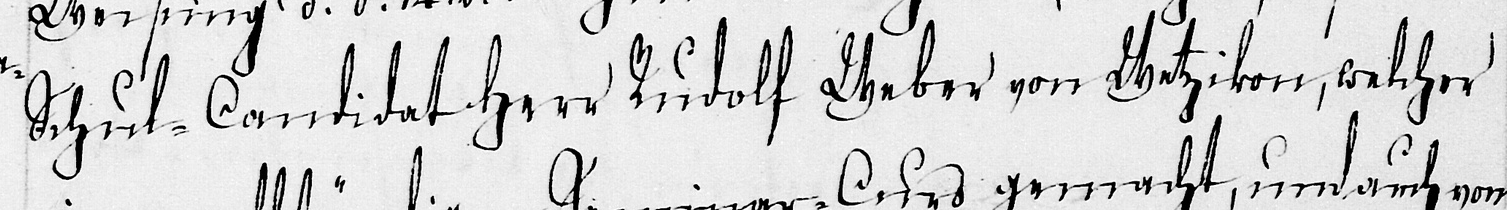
Schul-Candidat Herr Rudolf Weber von Wetzikon, welcher
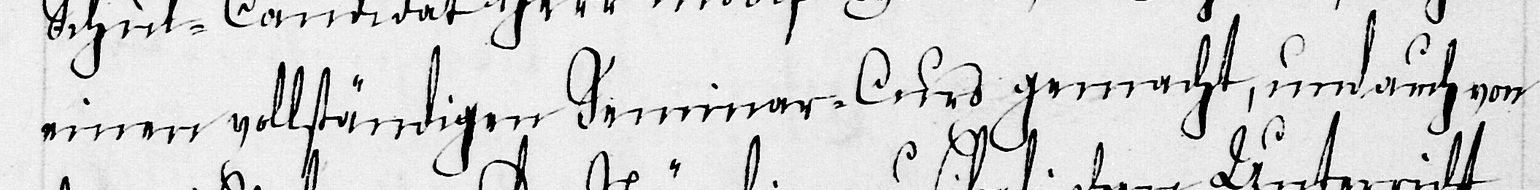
einen vollständigen Seminar-Curs gemacht, und auch von
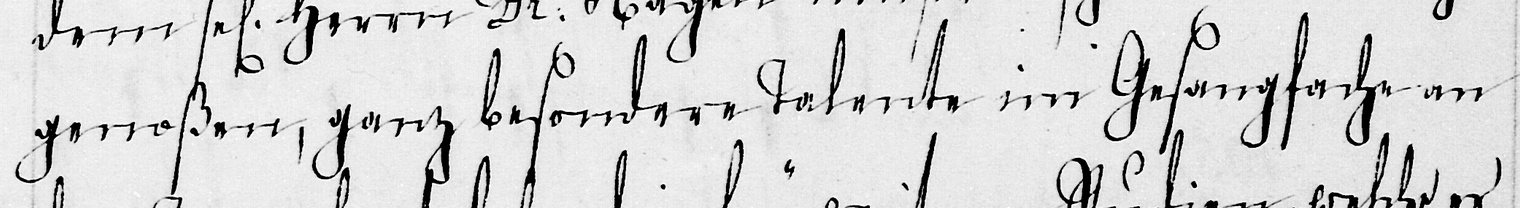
genoßen, ganz besondere Talente im Gesangfache an
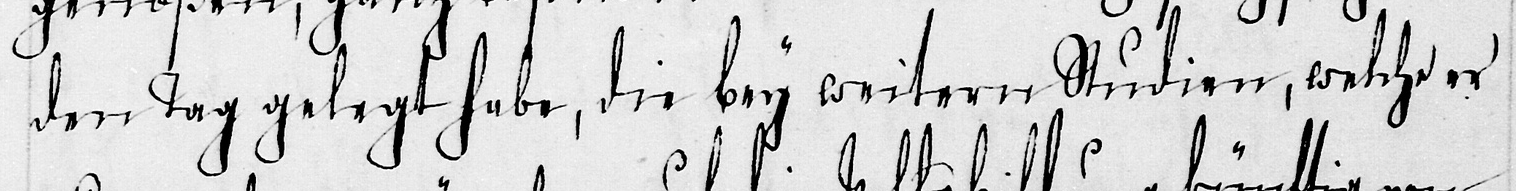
den Tag gelegt habe, die bey weitern Studien, welche er
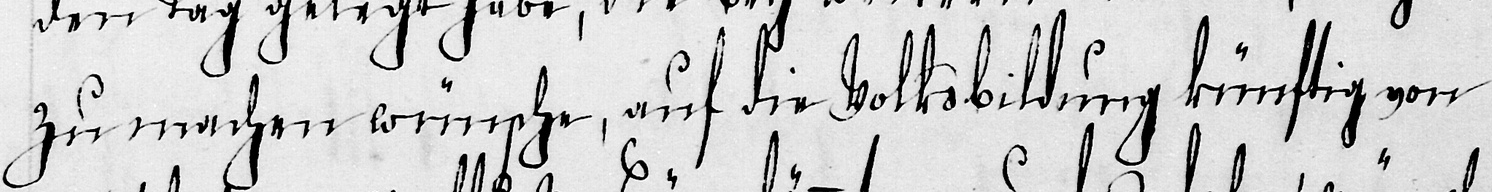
zu machen wünsche, auf die Volksbildung künftig von
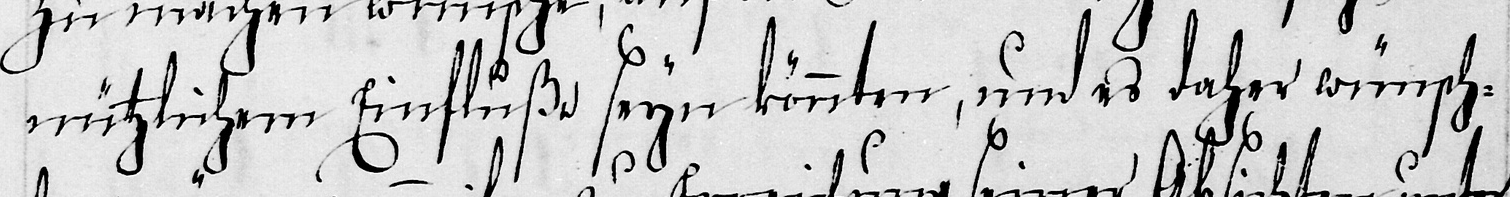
nützlichem Einfluße seyn könnten, und es daher wünsch¬
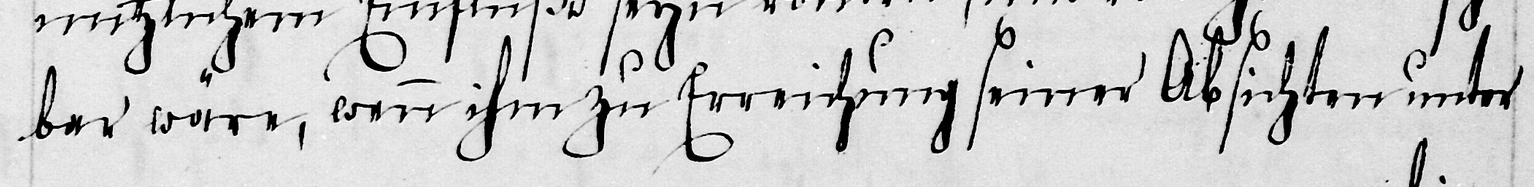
bar wäre, wenn ihm zu Erreichung seiner Absichten unter
